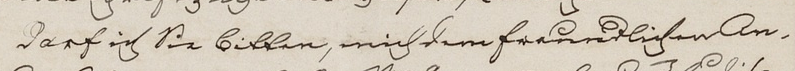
Darf ich Sie bitten, mich dem freundlichen An-
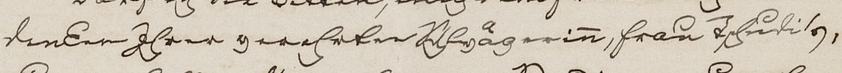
denken Ihrer verehrten Schwägerinn, Frau Tschudi's,
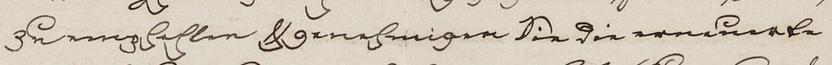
zu emphehlen & genehmigen Sie die erneuerte
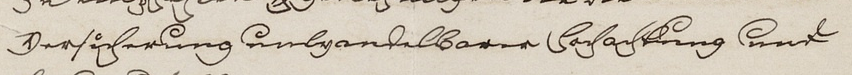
Versicherung unwandelbarer Hochachtung und
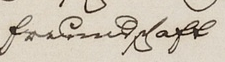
Freundschaft
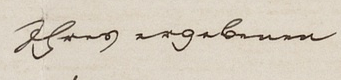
Ihres ergebenen
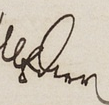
Escher
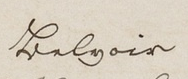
Belvoir
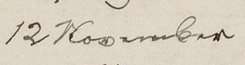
12 November
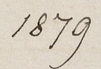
1879
